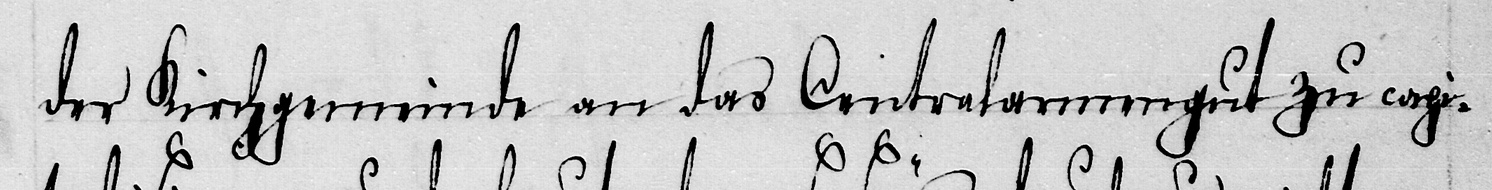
der Kirchgemeinde an das Centralarmengut zu capi¬
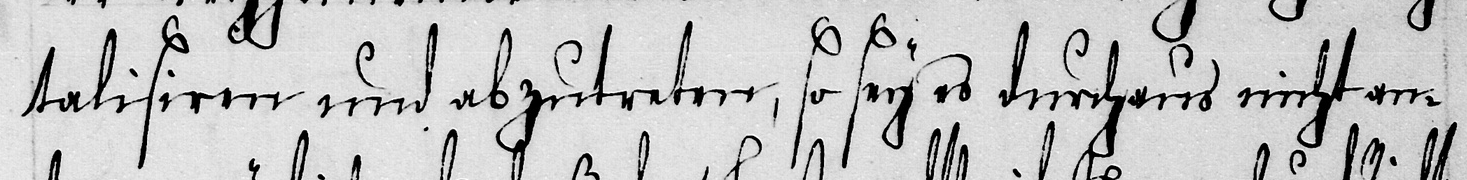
talisiren und abzutreten, so sey es durchaus nicht an¬
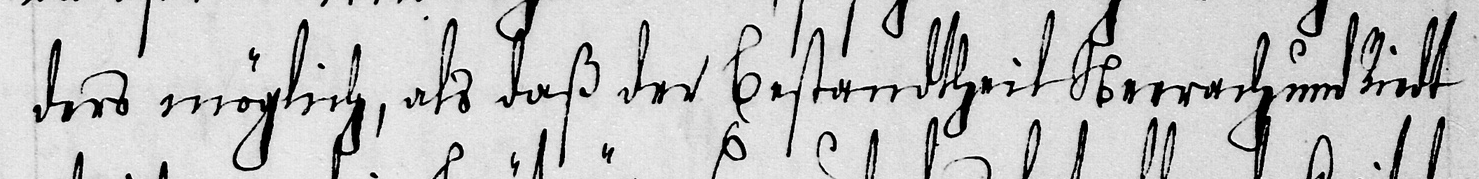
ders möglich, als daß der Bestandtheil Neerach und Riedt
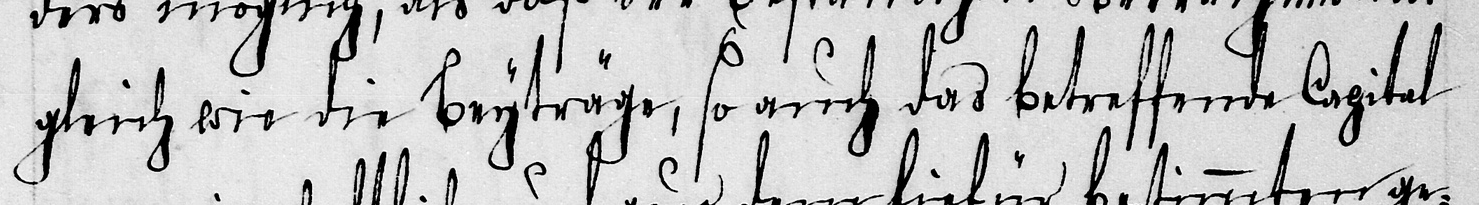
gleich wie die Beyträge, so auch das betreffende Capital
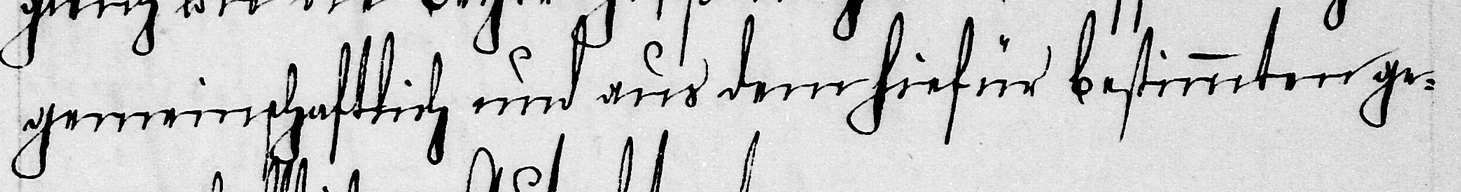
gemeinschaftlich und aus dem hiefür bestimmten ge¬
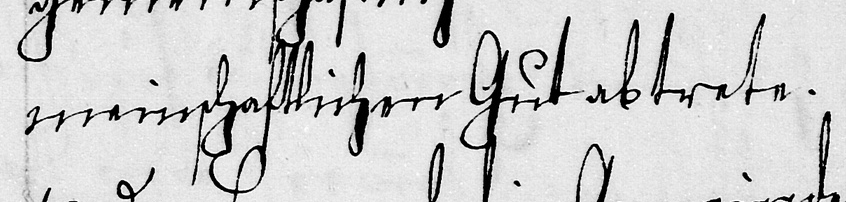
meinschaftlichen Gut abtrete.
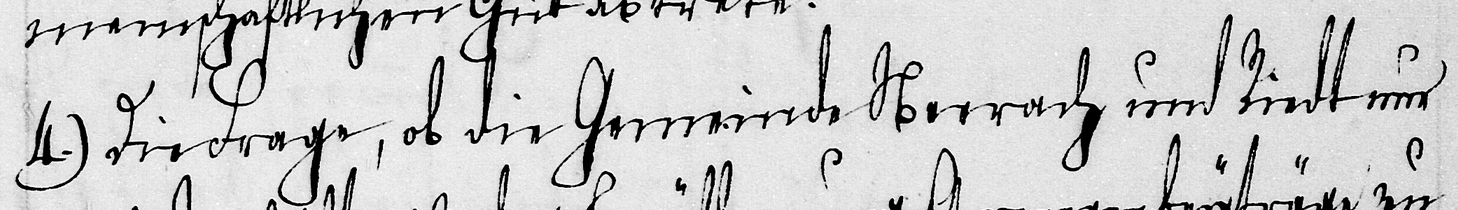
4.) Die Frage, ob die Gemeinde Neerach und Riedt nur
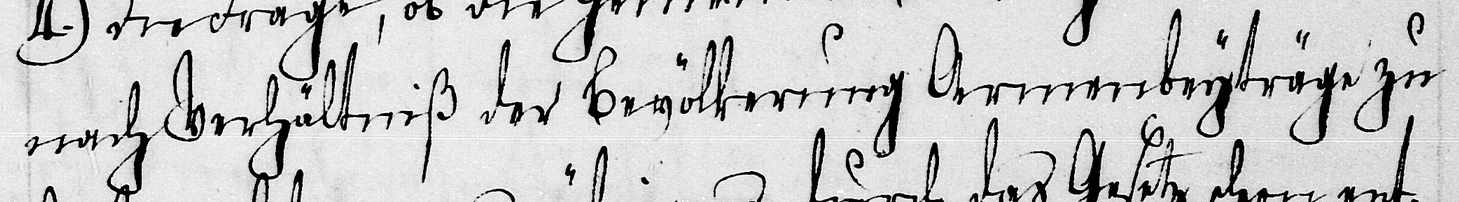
nach Verhältniß der Bevölkerung Armenbeyträge zu
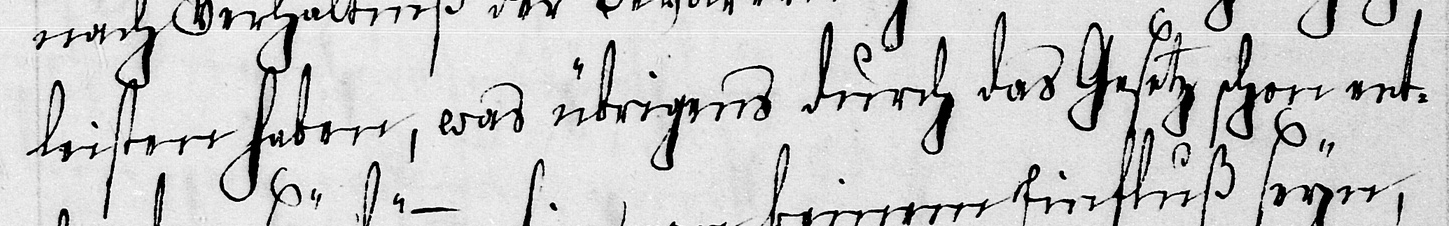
leisten haben, was übrigens durch das Gesetz schon ent¬
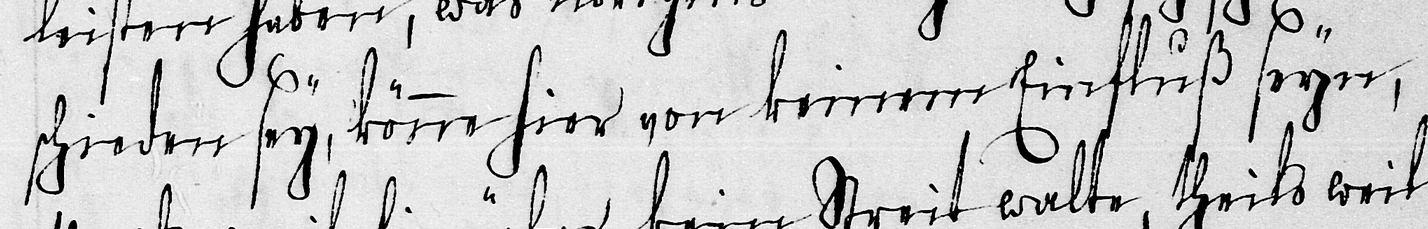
schieden sey, könne hier von keinem Einfluß seyn,
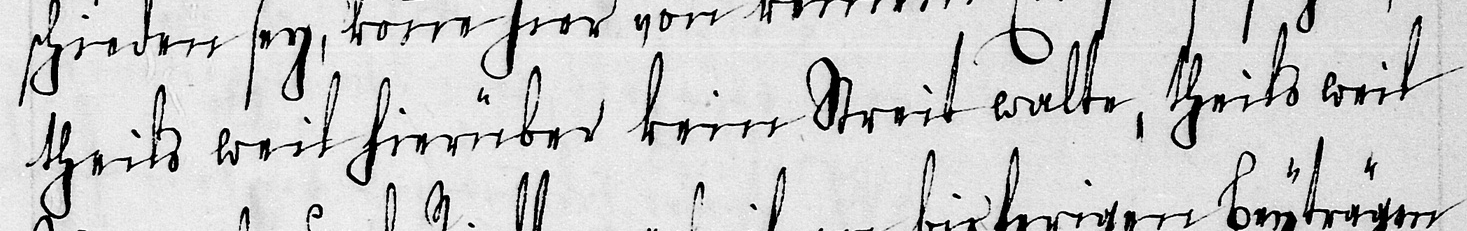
theils weil hierüber kein Streit walte, theils weil
